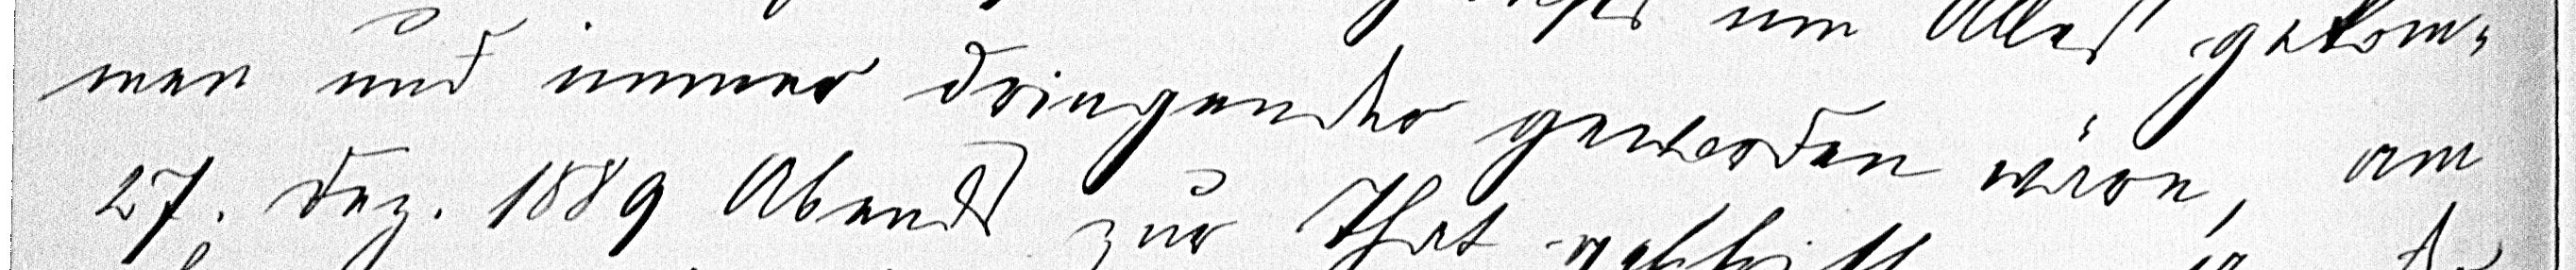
men und immer Dringender geworden wäre, am
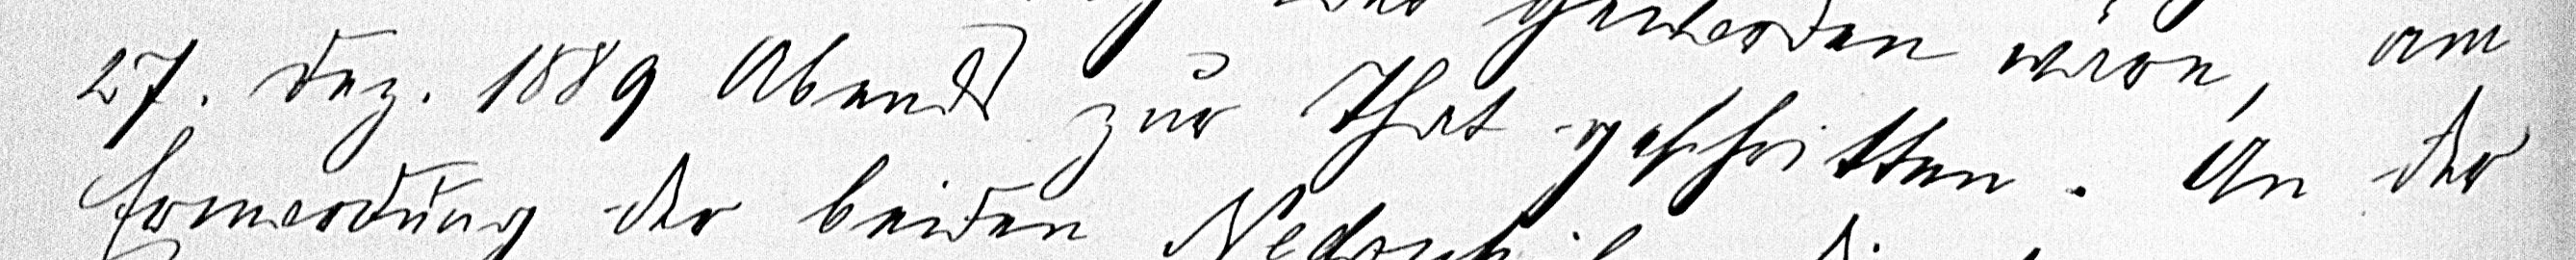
27. Dez. 1889 Abends zur That geschritten. An der
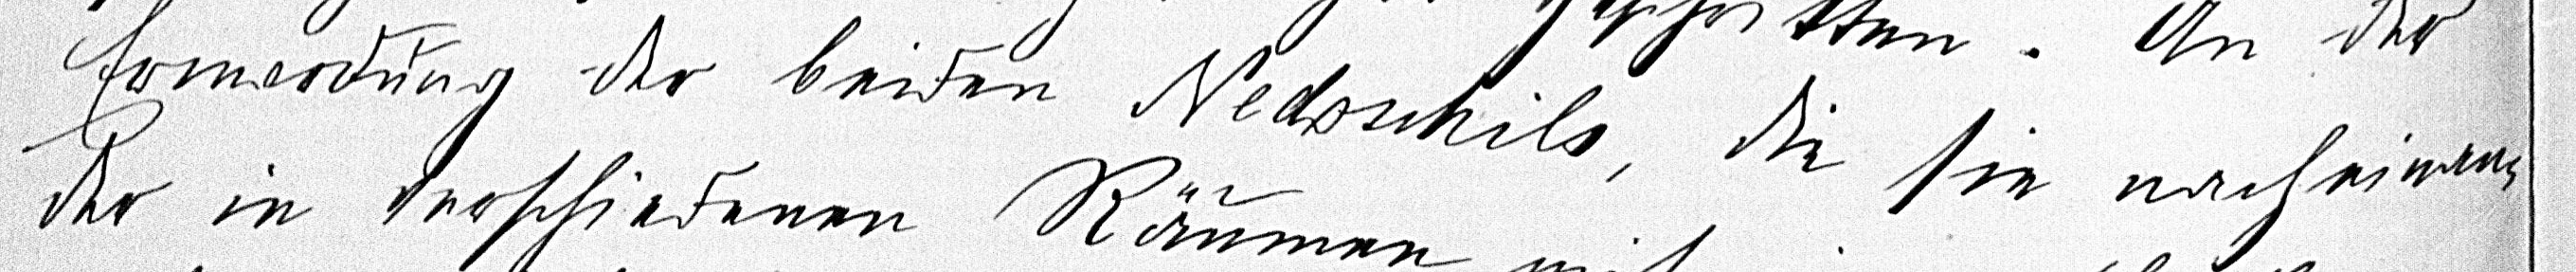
Ermordung der beiden Nedoschils, die sie nacheinan¬
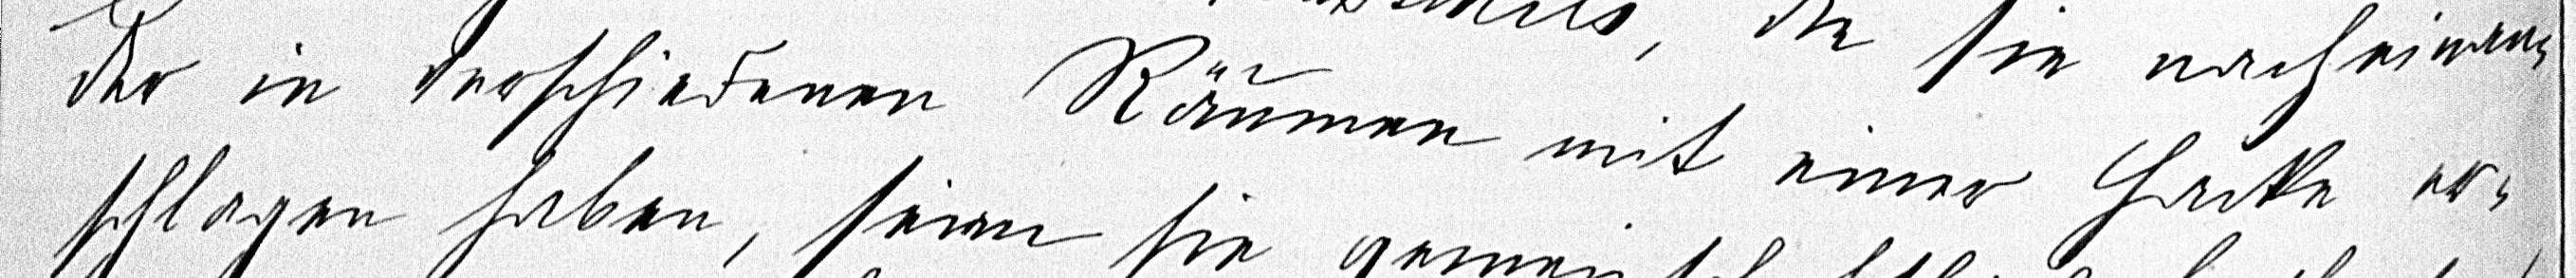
der in verschiedenen Räumen mit einer Hacke er¬
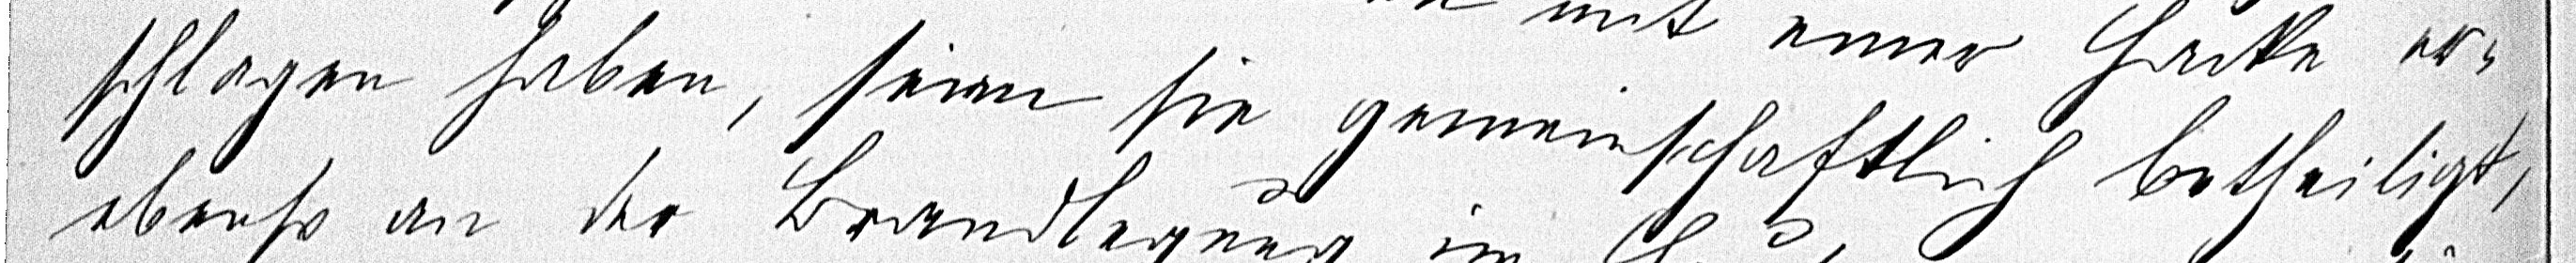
schlagen haben, seien sie gemeinschaftlich betheiligt,
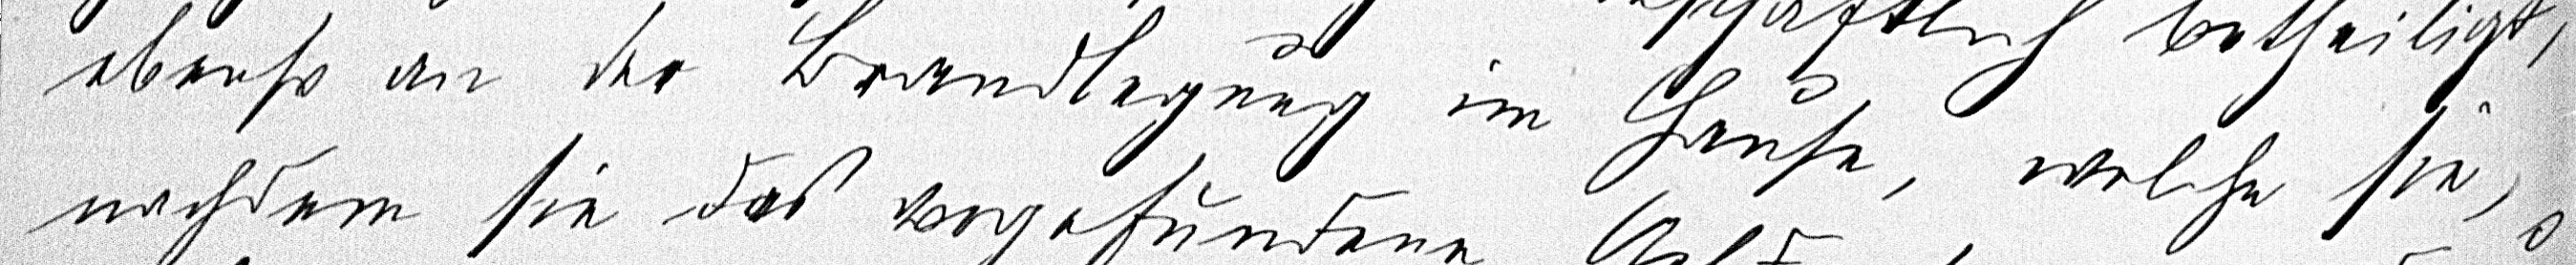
ebenso an der Brandlegung im Hause, welche sie,
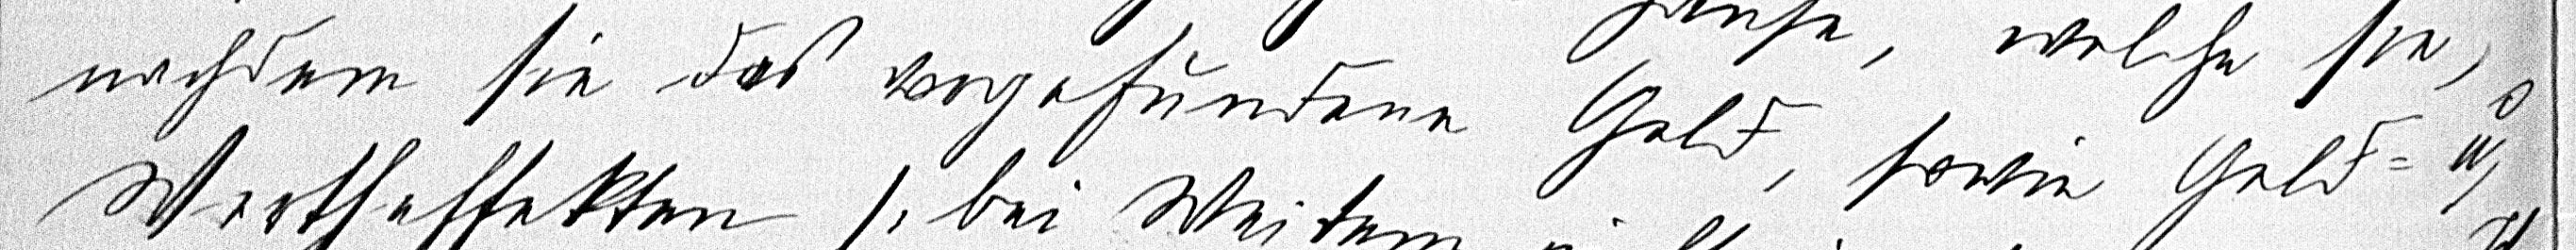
nachdem sie das vogefundene Geld, sowie Geld- u,
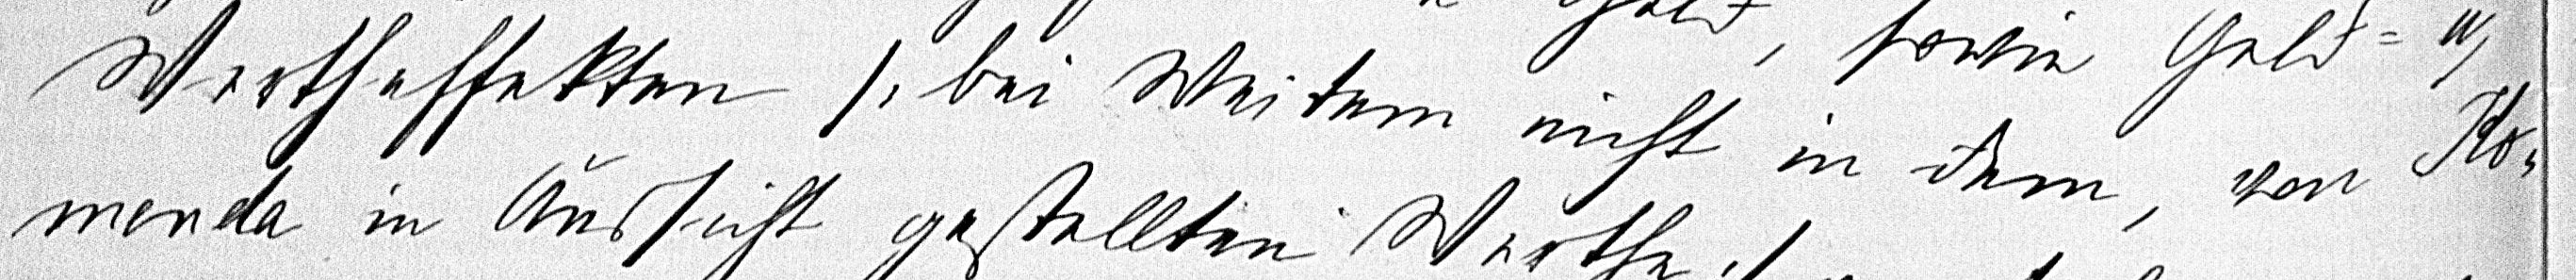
Wertheffekten /:bei Weitem nicht in dem, von Ko¬
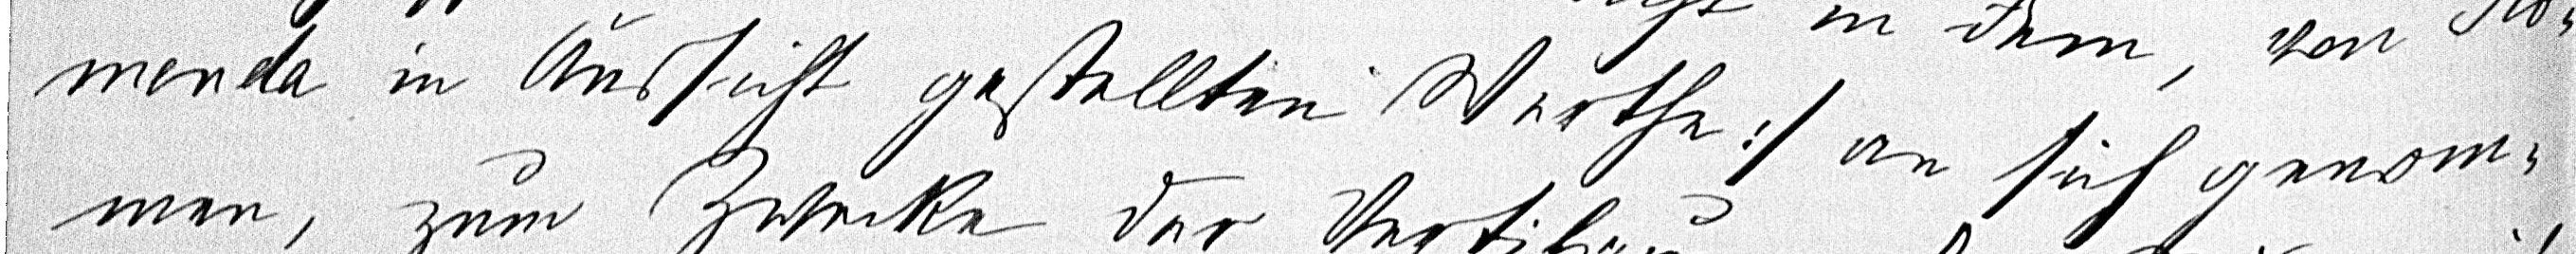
menda in Aussicht gestellten Werthe:/ an sich genom¬
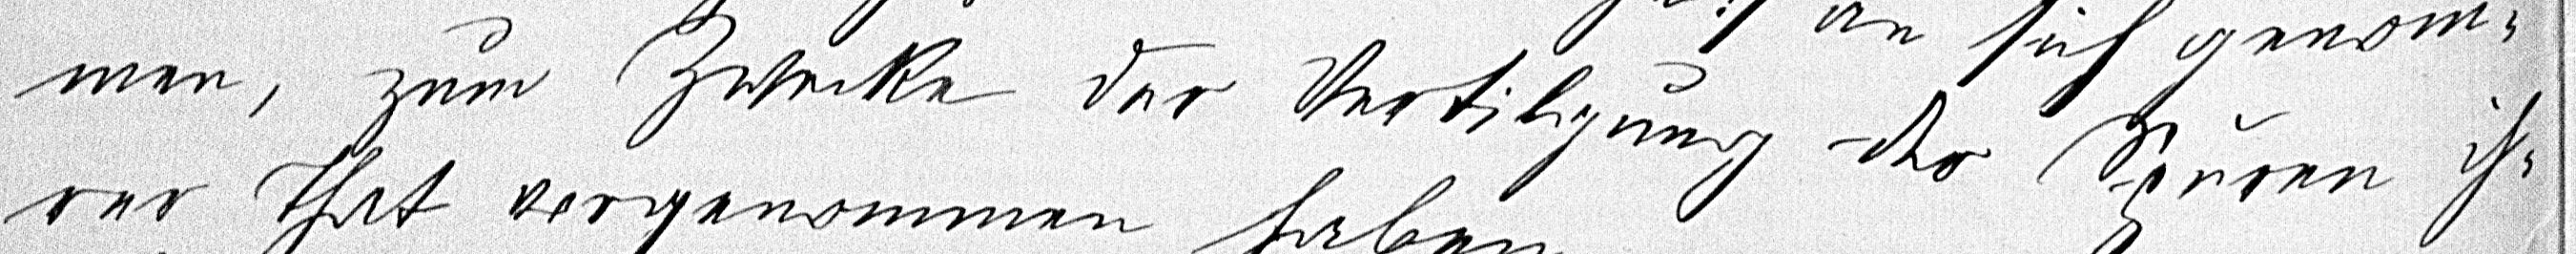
men, zum Zwecke der Vertilgung der Spuren ich¬
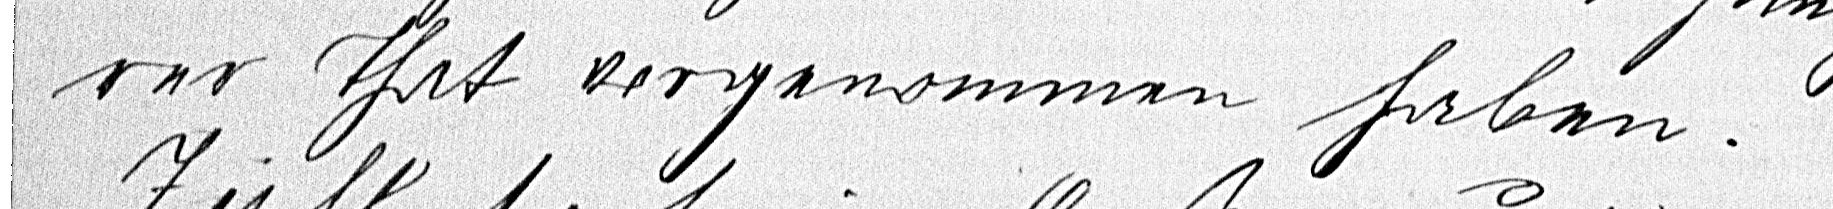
rer That vorgenommen haben.
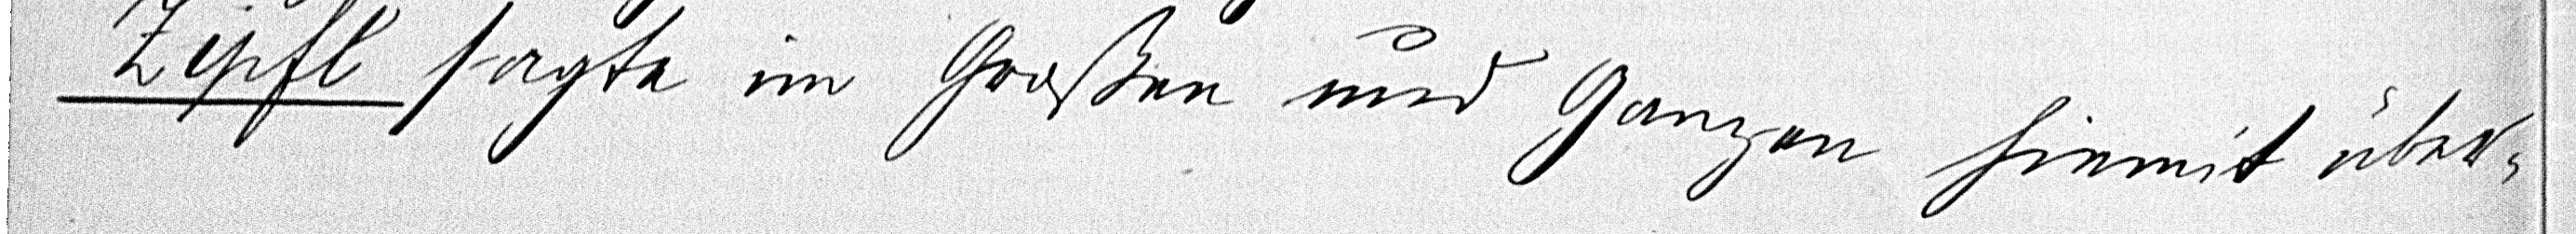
Zipfl sagte im Großen und Ganzen hiemit über¬
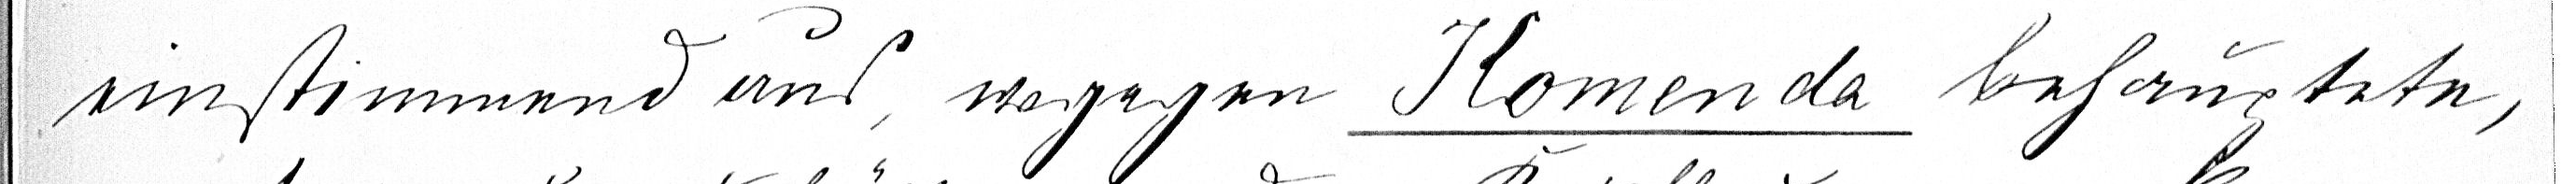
einstimmend und, wogegen Komenda behauptete,
